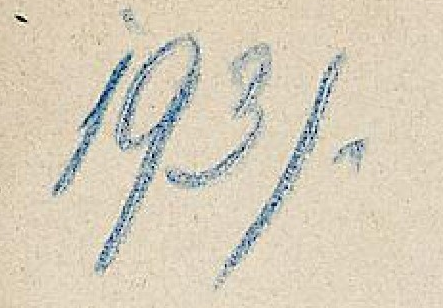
193).
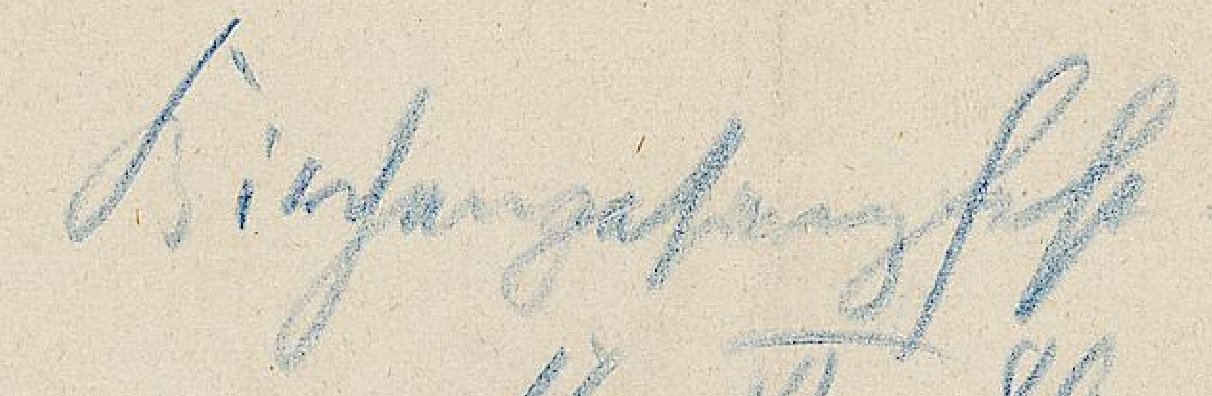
Kirchengesangfest
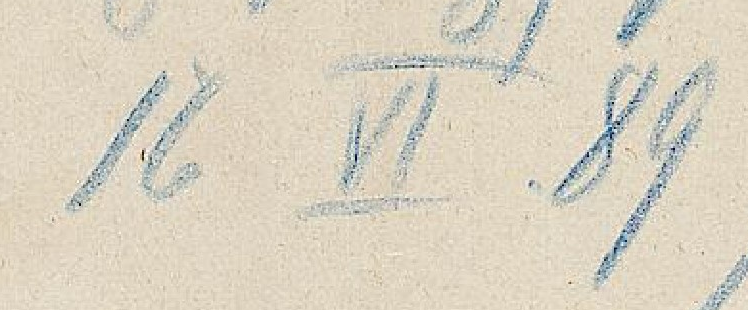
16. VI 89
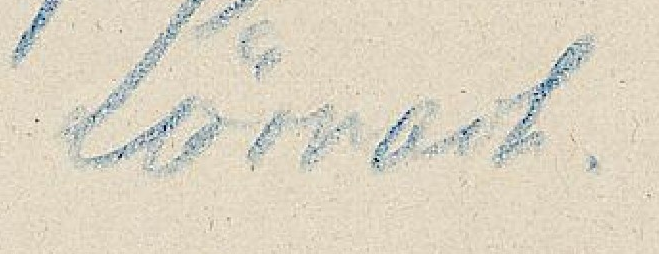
Lörrach
